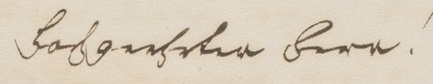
Hochgeehrter Herr!
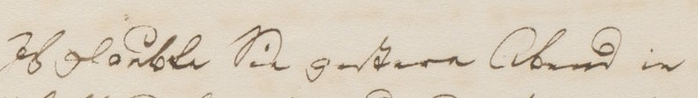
Ich glaubte Sie gestern Abend in
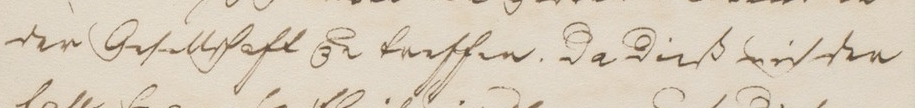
der Gesellschaft zu treffen. Da dieß nicht der
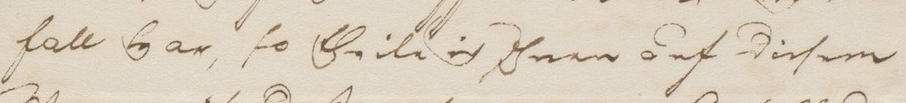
Fall war, so theile ich Ihnen auf diesem
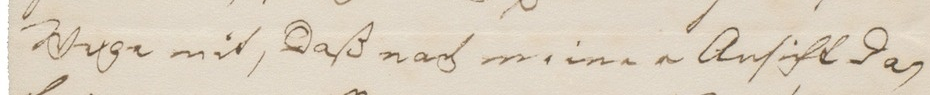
Wege mit, daß nach meiner Ansicht das
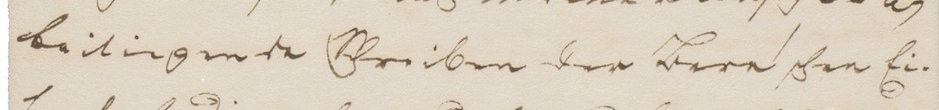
beiliegende Schreiben der Bern'schen Ei-
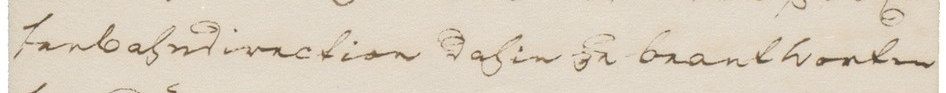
senbahndirection dahin zu beantworten
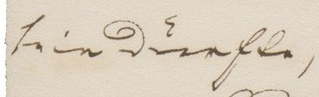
sein dürfte,
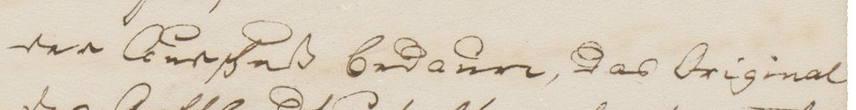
«der Ausschuß bedaure, das Original
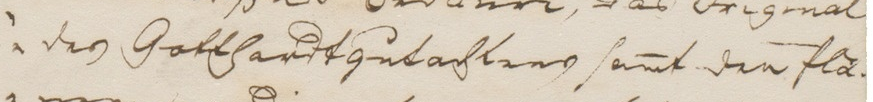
des Gotthardtgutachtens sammt den Plä-
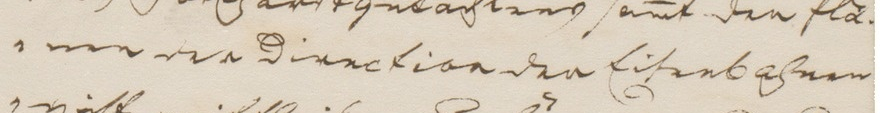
nen der Direction der Eisenbahnen
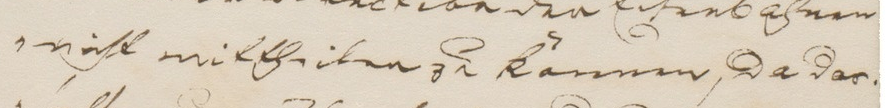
nicht mittheilen zu können, da das-
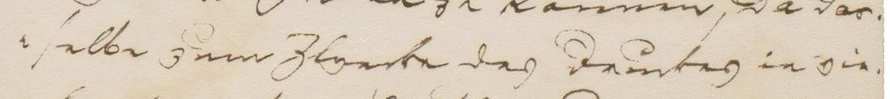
selbe zum Zwecke des Druckes in vie-
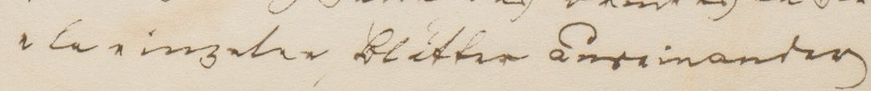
le einzelne Blätter auseinander
